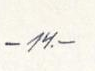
14
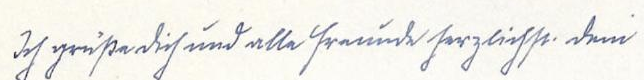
Ich grüße dich und deine Freunde herzlichst dein
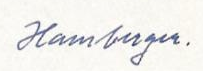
Hamberger
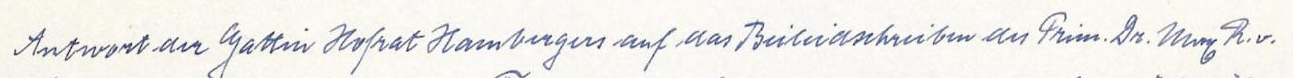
Antwort der Gattin Hofrat Hambergers auf das Beileidschreiben dan Prim.Dr. Max R. v.
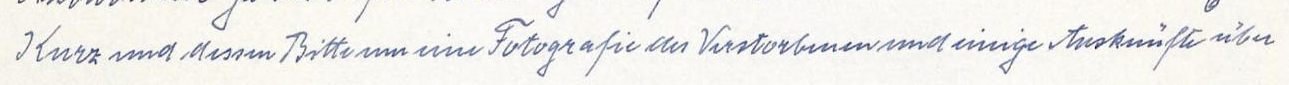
Kurz und dessen Bitte um eine Fotografie des Verstorbenen und einige Auskünfte über
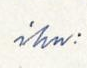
ihn:
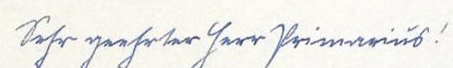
Sehr geehrter Herr Primarius!
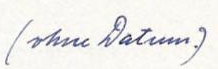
(ohne Datum)
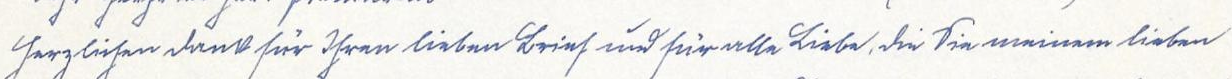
Herzlichen Dank für Ihren lieben Brief und für alle Liebe, die sie meinem lieben
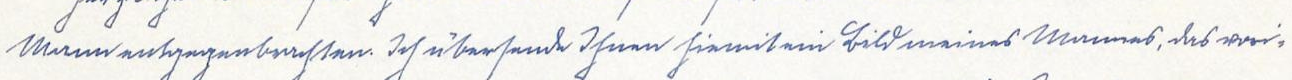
Mann entgegen brachten. Ich übersende Ihnen hiermit ein Bild meines Mannes, das vori-
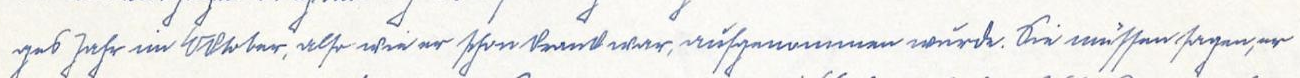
ges Jahr im Oktober, also wie er schon krank war, aufgenommen wurde. Sie müssen sagen, er
